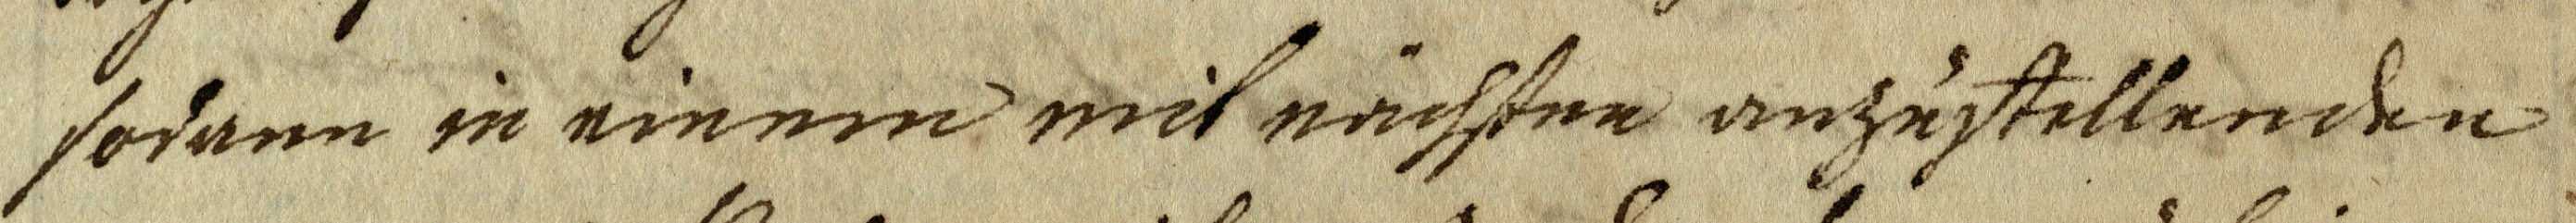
sodann in einem mit nächsten anzustellenden
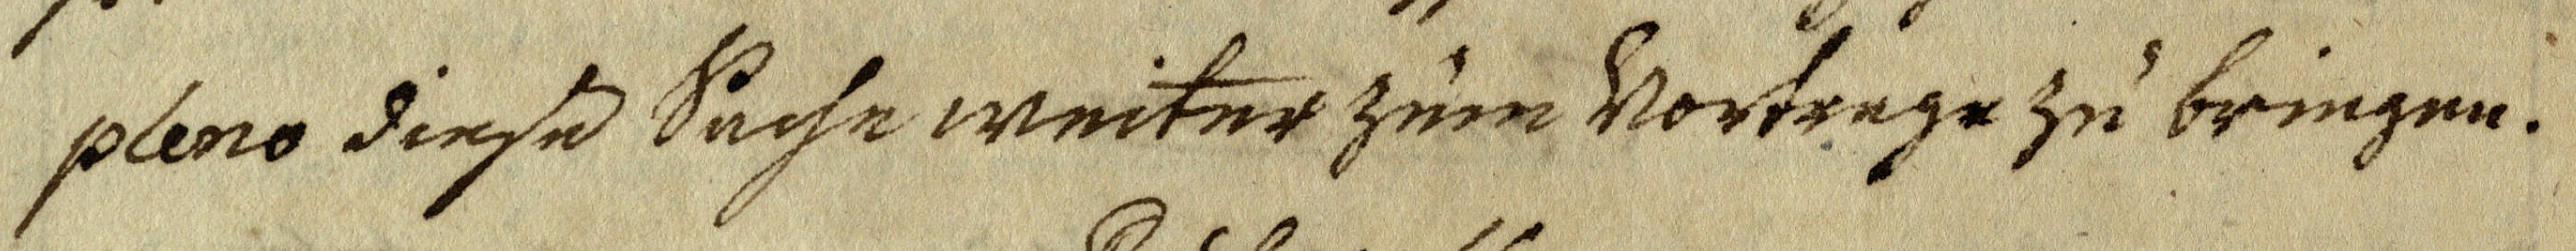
pleno diese Sache weiter zum Vortrage zu bringen.
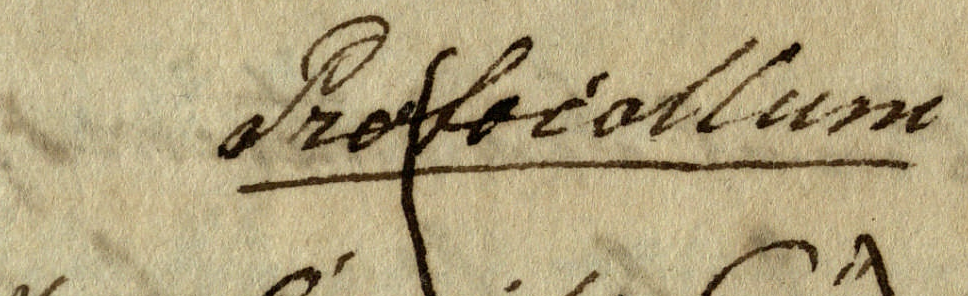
Protocollum
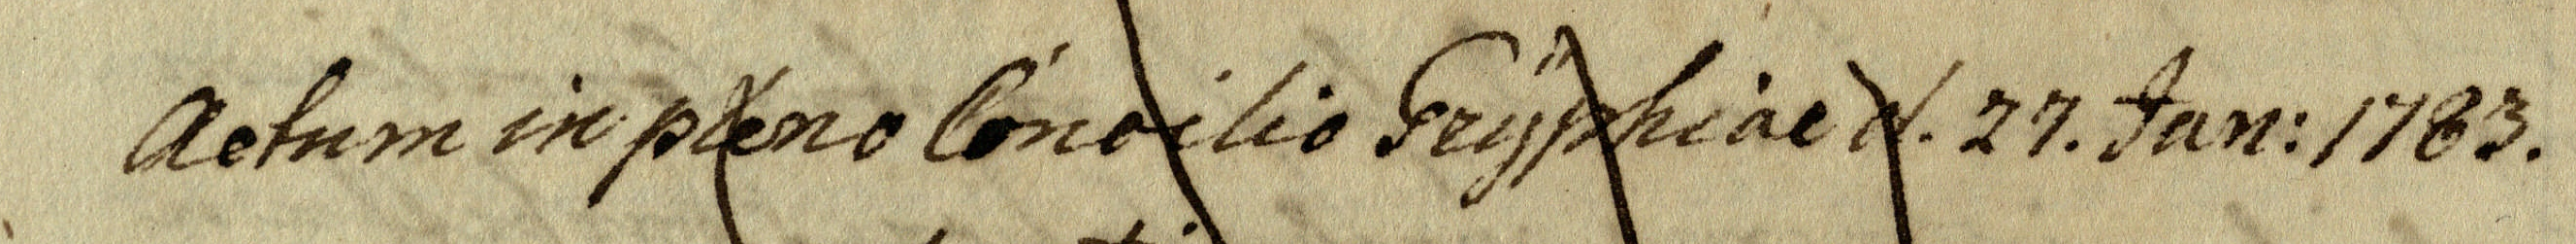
actum in pleno Concilio Grÿphiae d. 27. jan. 1783.
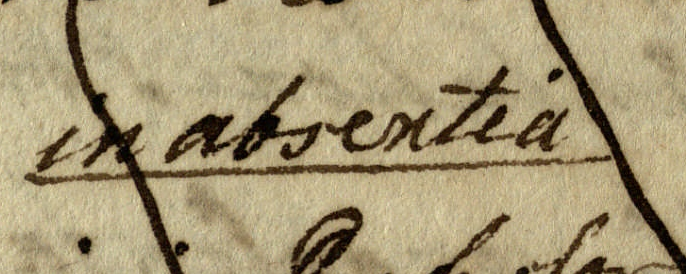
in absentia
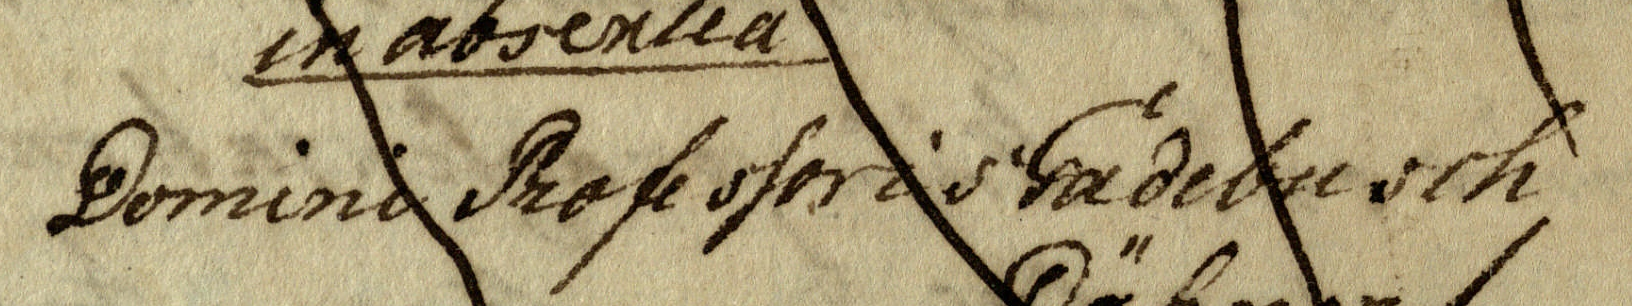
Domini Professoris Gadebusch
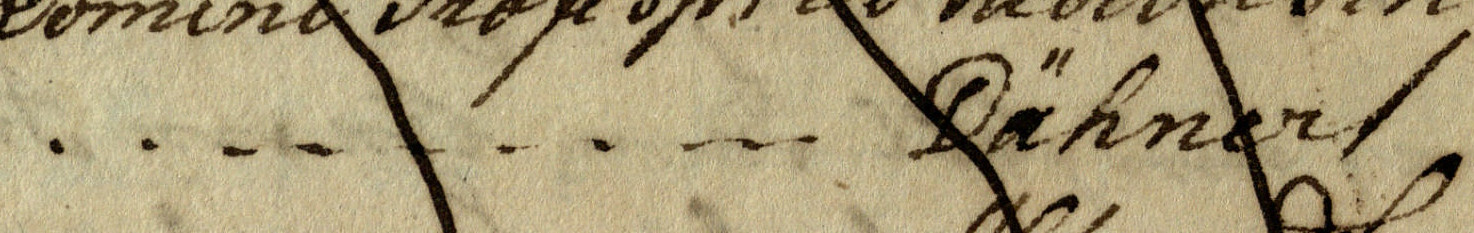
Dähnert
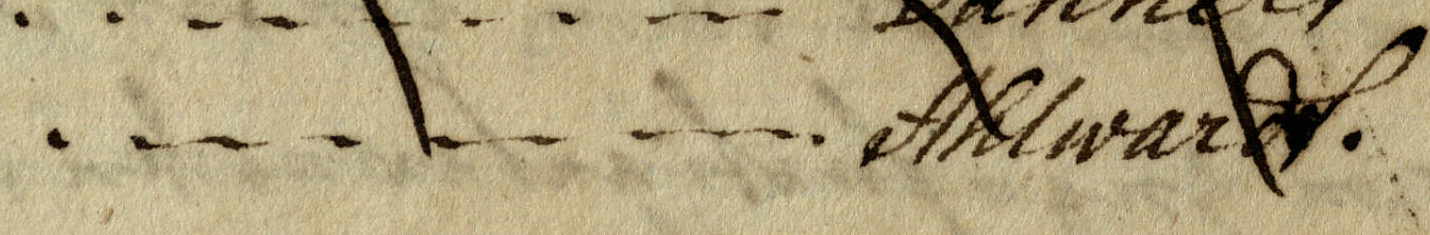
Ahlwardt.
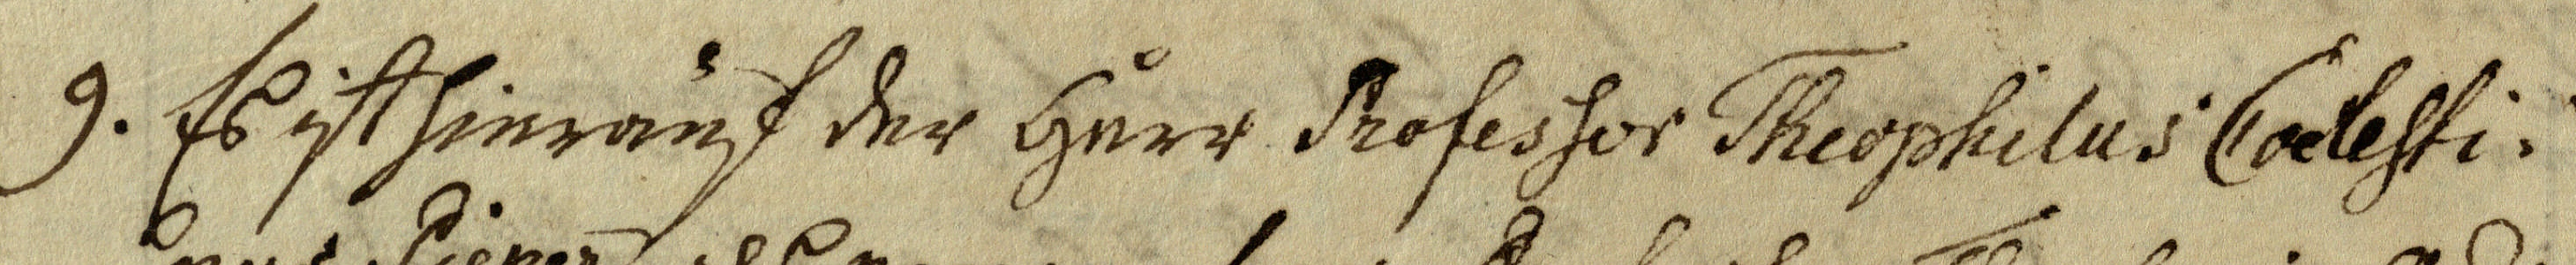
9. Es ist hierauf der Herr Professor Theophilus Coelesti¬
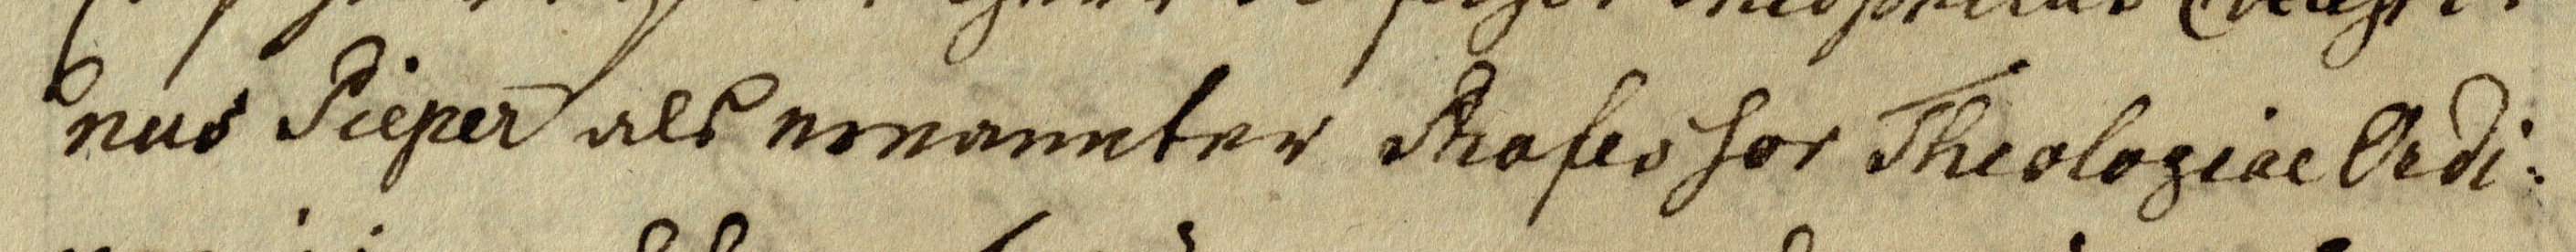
nus Pieper als ernannter Professor Theologiae Ordi¬
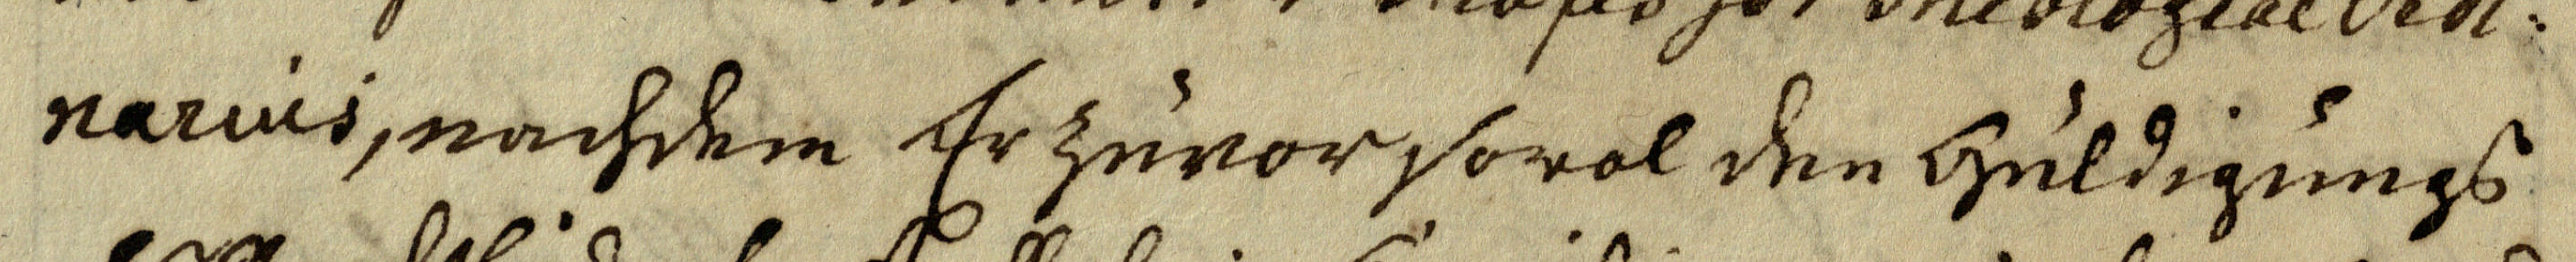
narius, nachdem Er zuvor sowol den Huldigungs
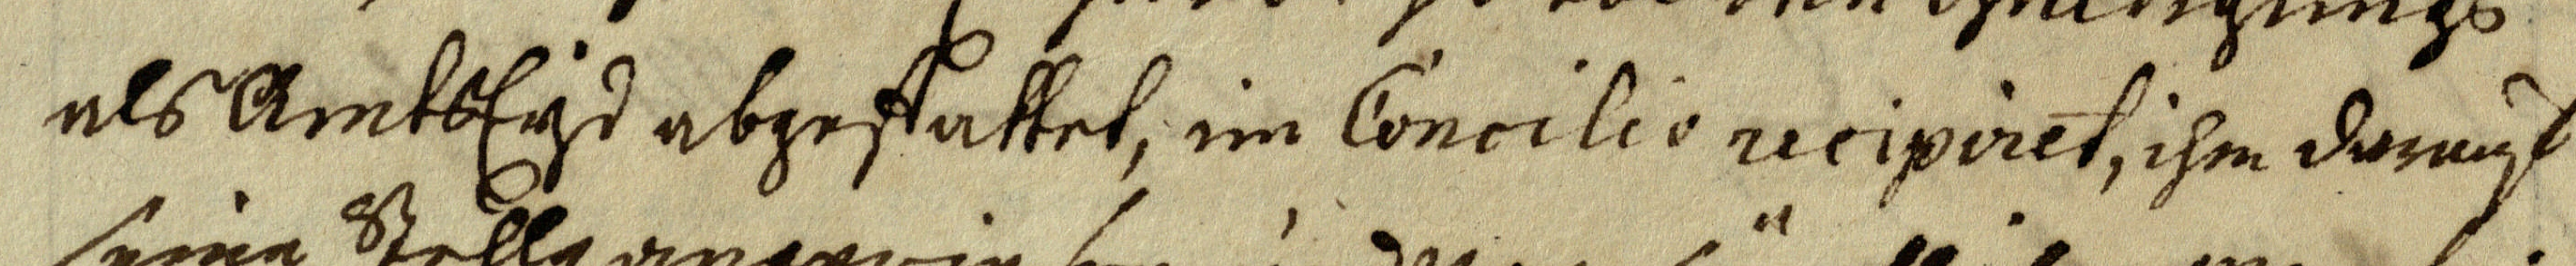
als AmtsEÿd abgestattet, im Concilio recipiret, ihm darauf
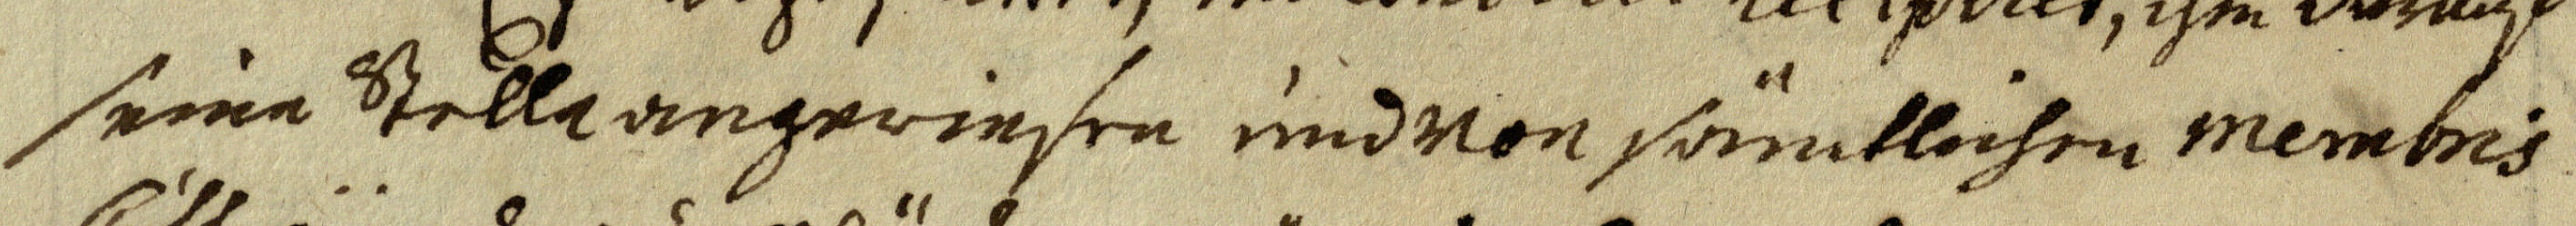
seine Stelle angewiesen und von sämtlichen membris
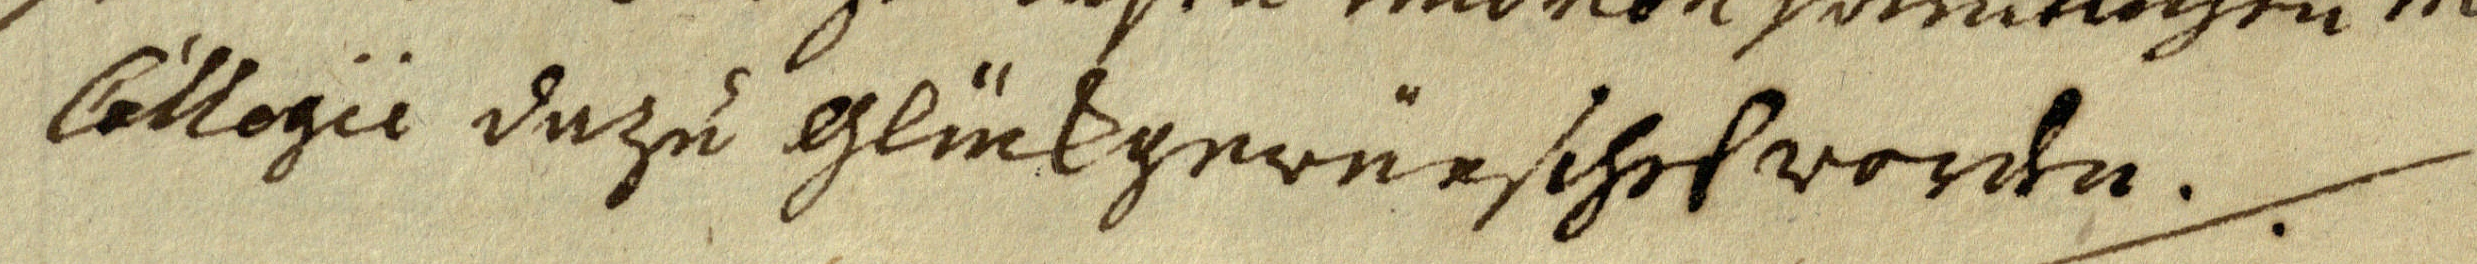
Collegii dazu Glückgewünschet worden.
